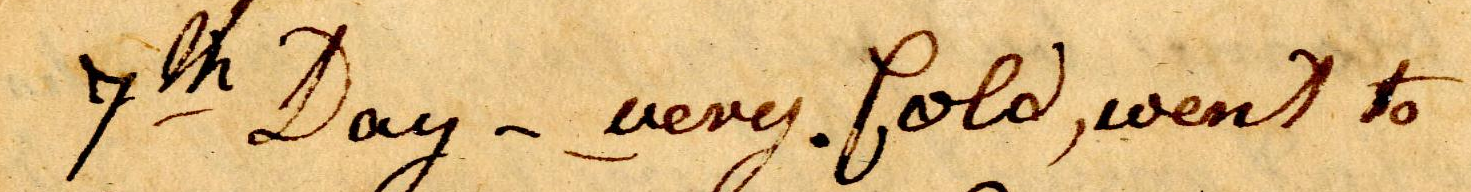7^th Day- very. Cold, went to
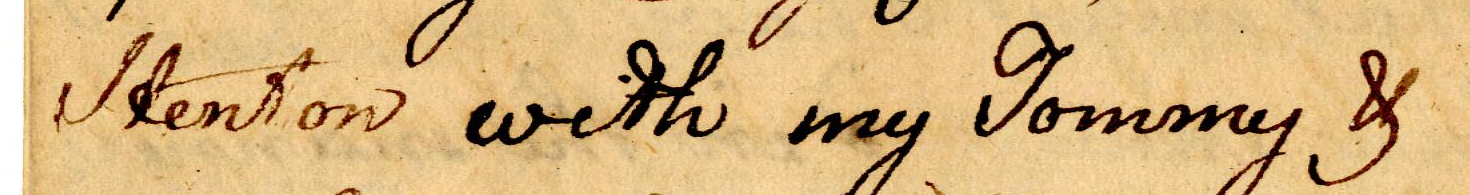Stenton with my Tommy &
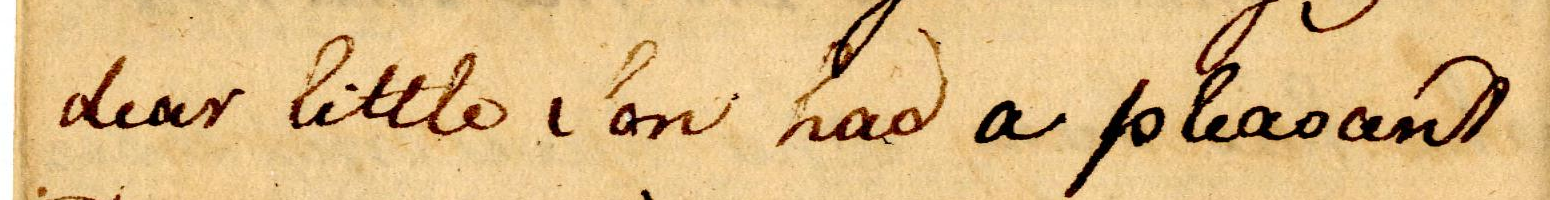dear little Son had a pleasant
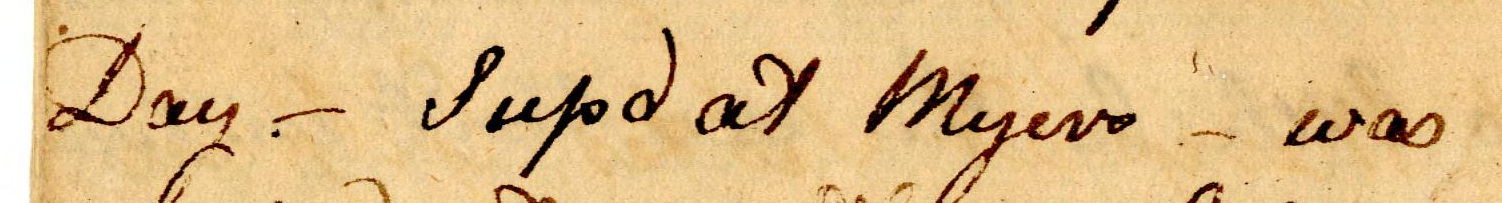Day- Supd at Myers- was
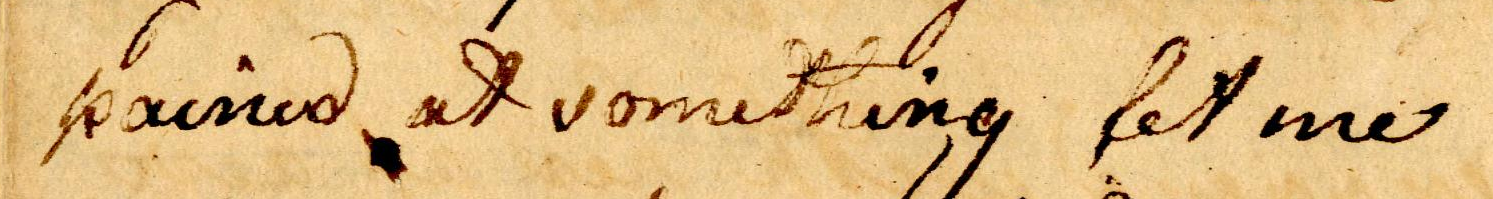pained, at something let me
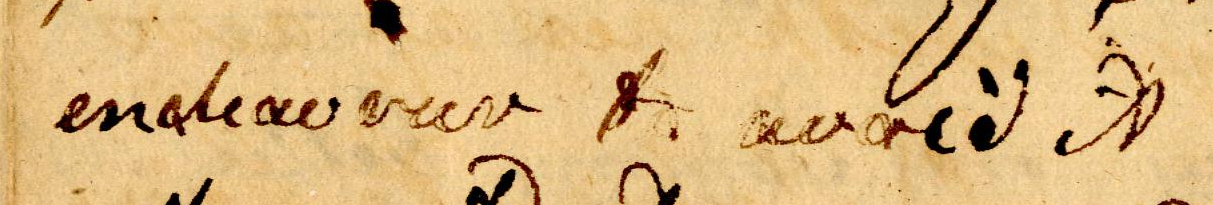endeavour to avoid it
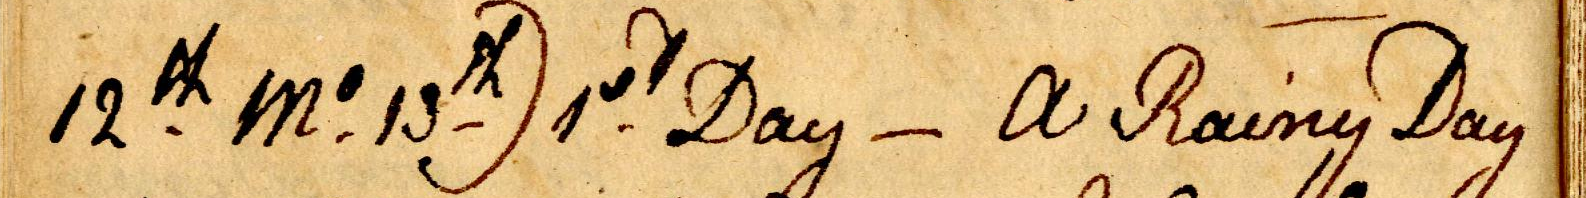12^th M^o 13^th) 1^st Day- A Rainy Day
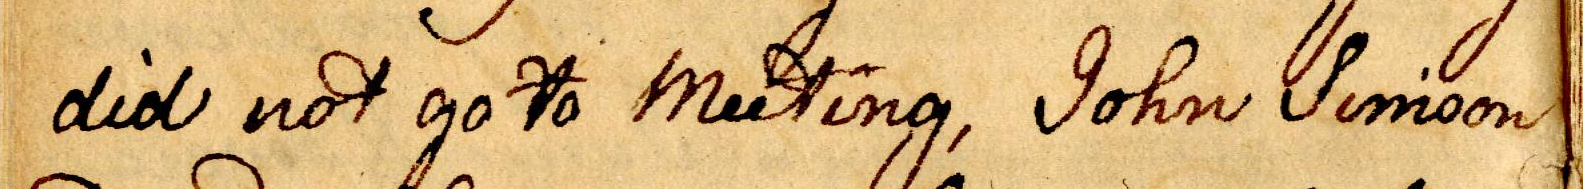did not go to Meeting, John Simoon
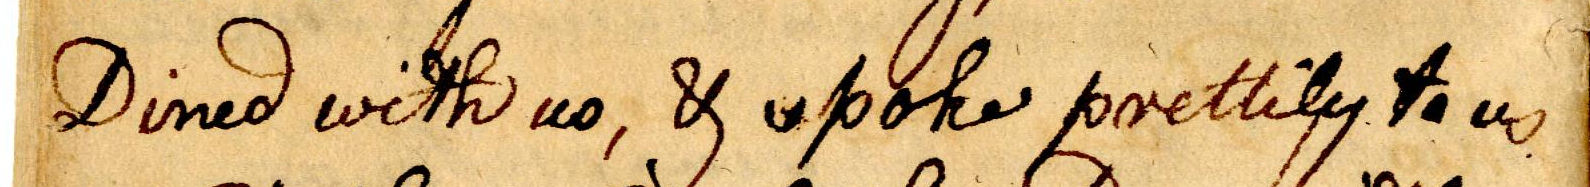Dined with us, & spoke prettily to us
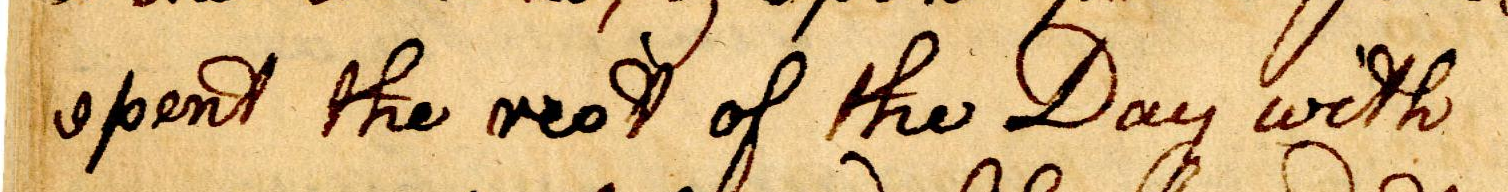spent the rest of the Day with
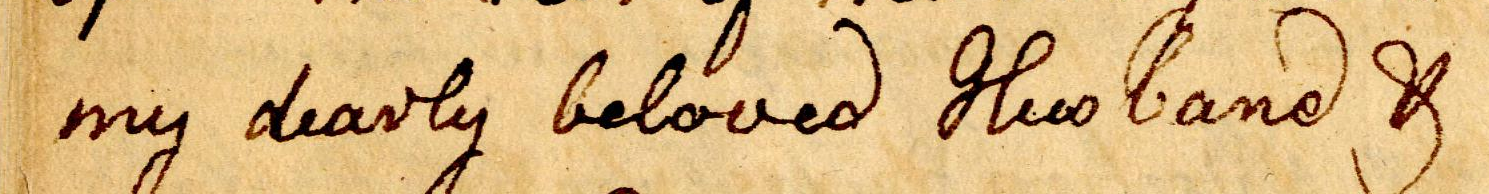my dearly beloved Husband &
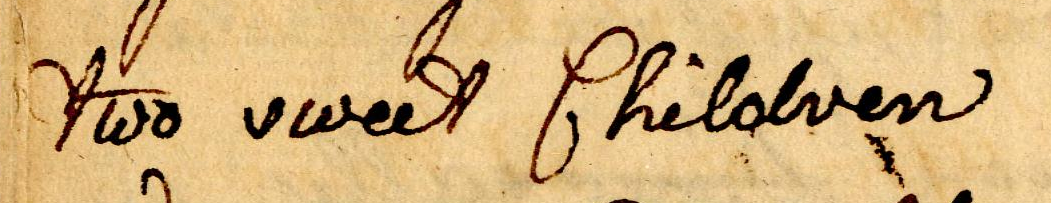two sweet Children
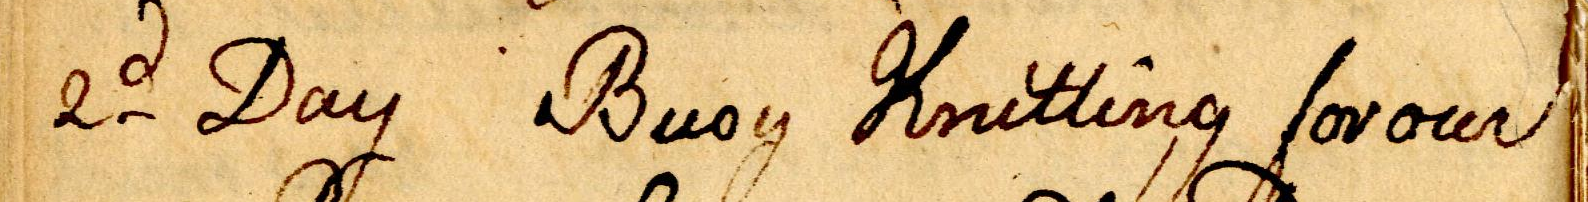2^d Day- Busy Knitting for our
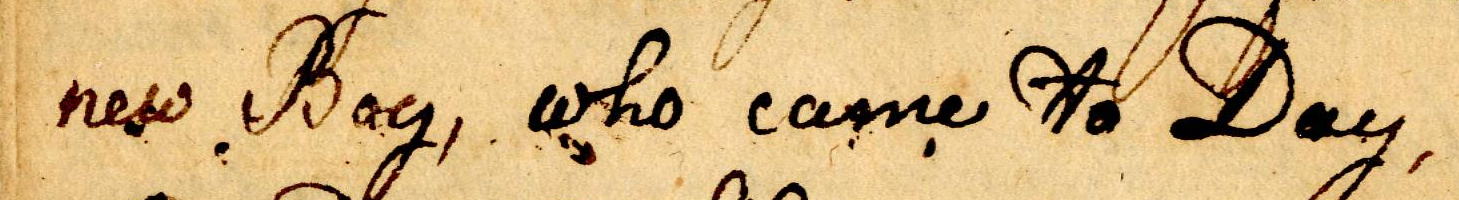new Boy, who came to Day,
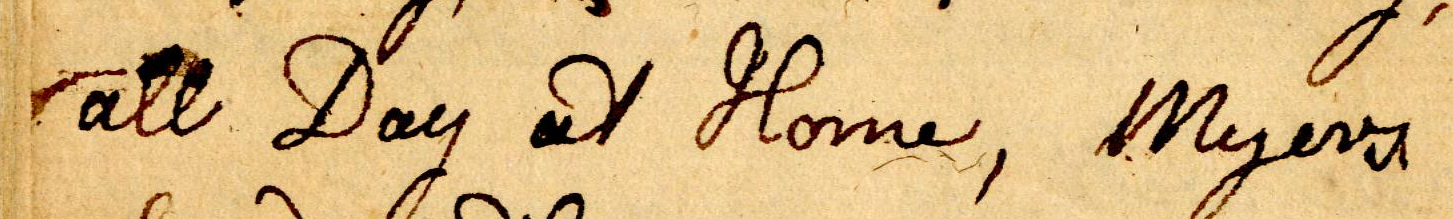all Day at Home, Myers
